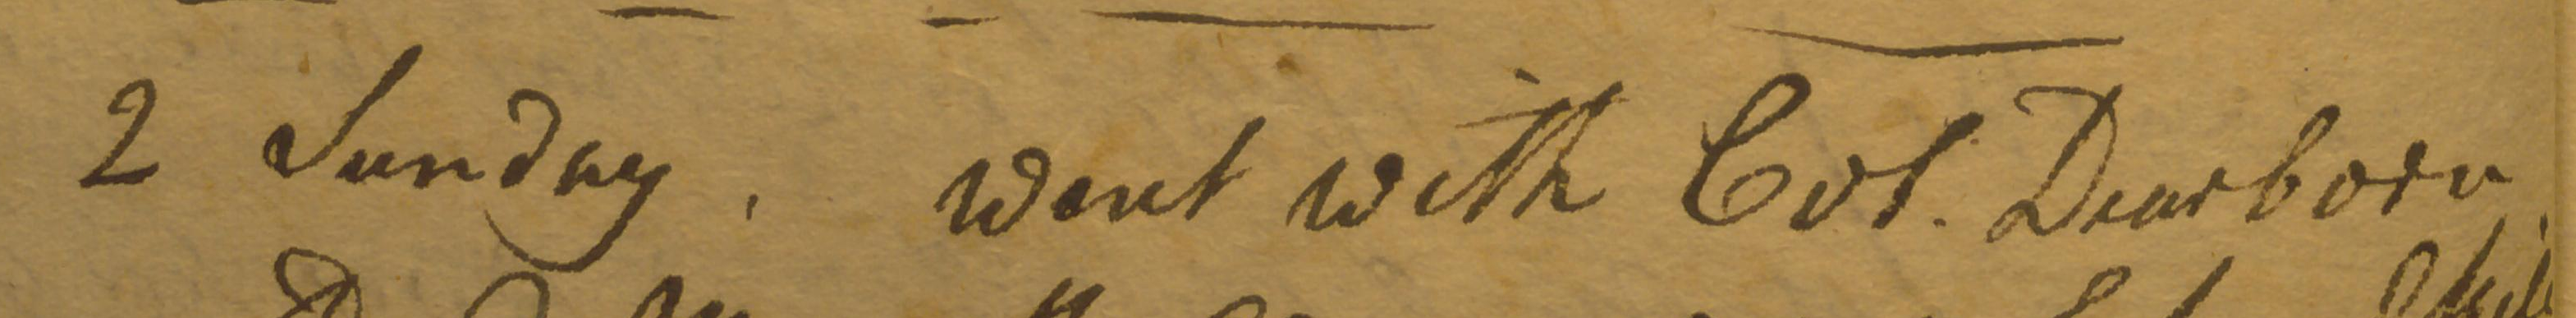2 Sunday. went with Col. Dearborn
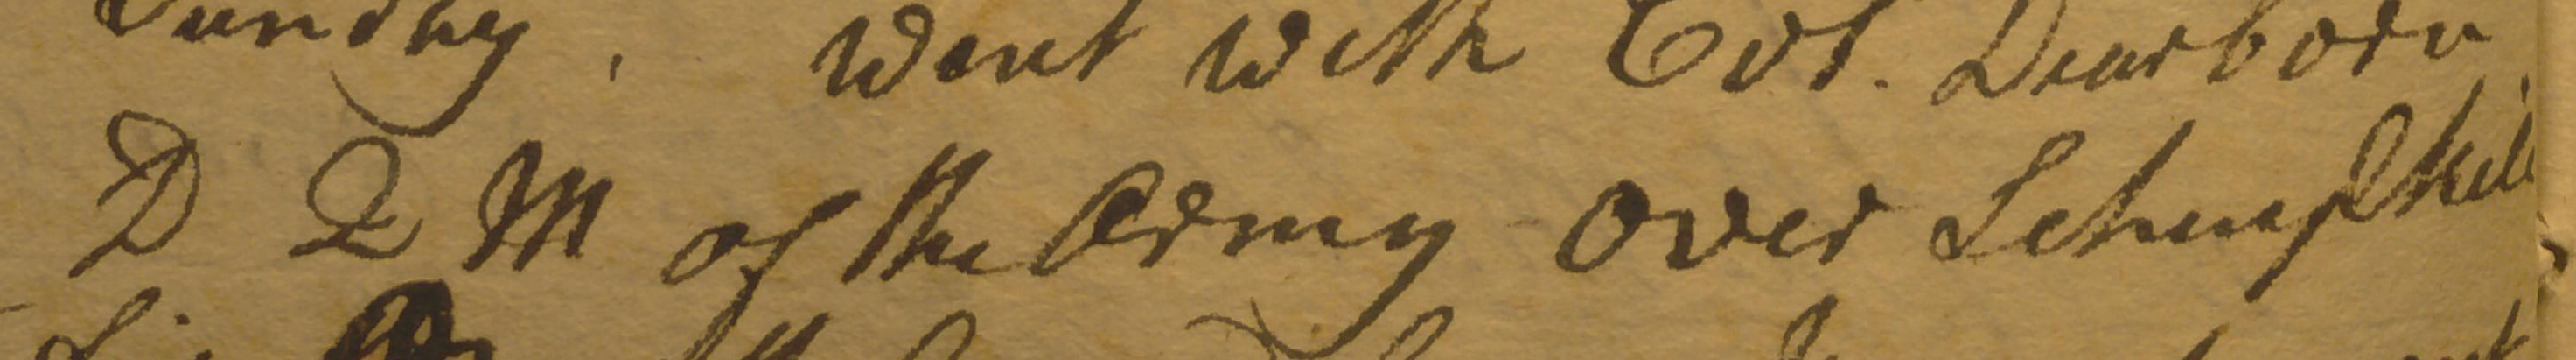DQM of the Army over Schuylkill
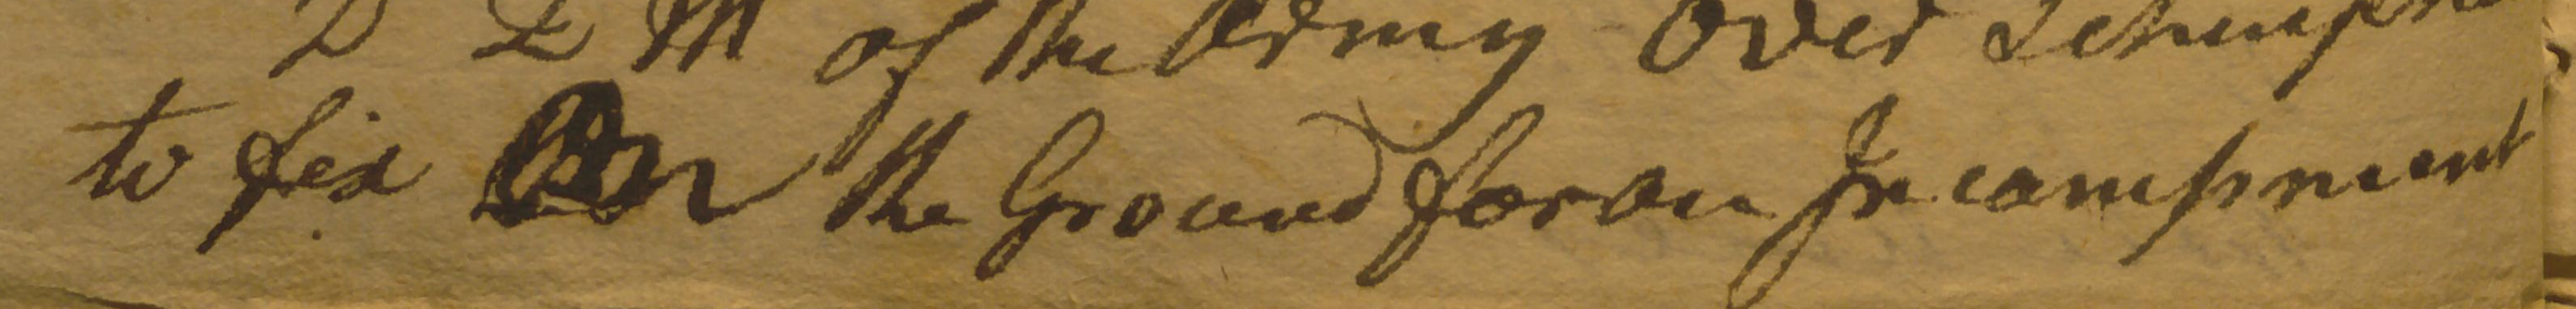to fis [__] the Ground for an Incampment
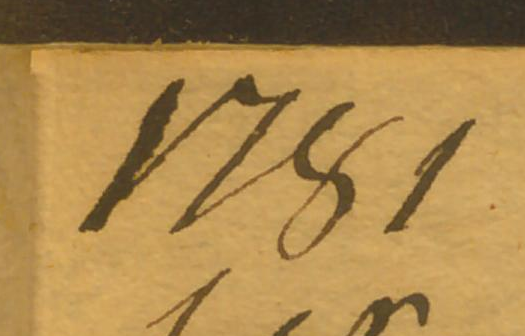1781
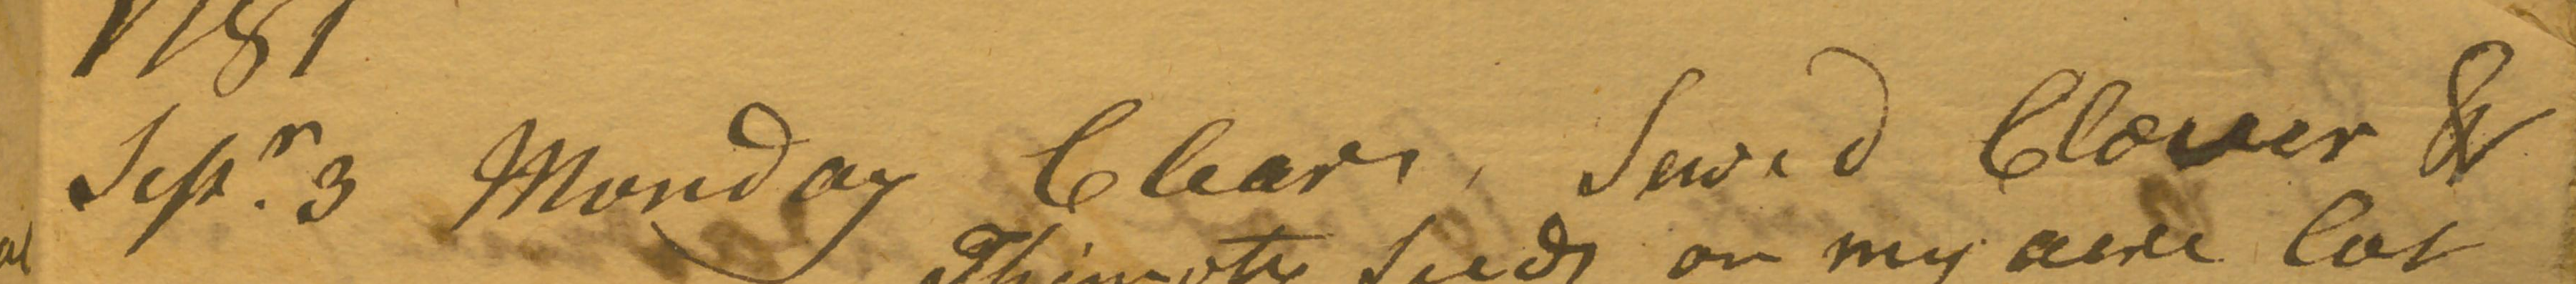Sep^r. 3 Monday Clear, sewed Clover &
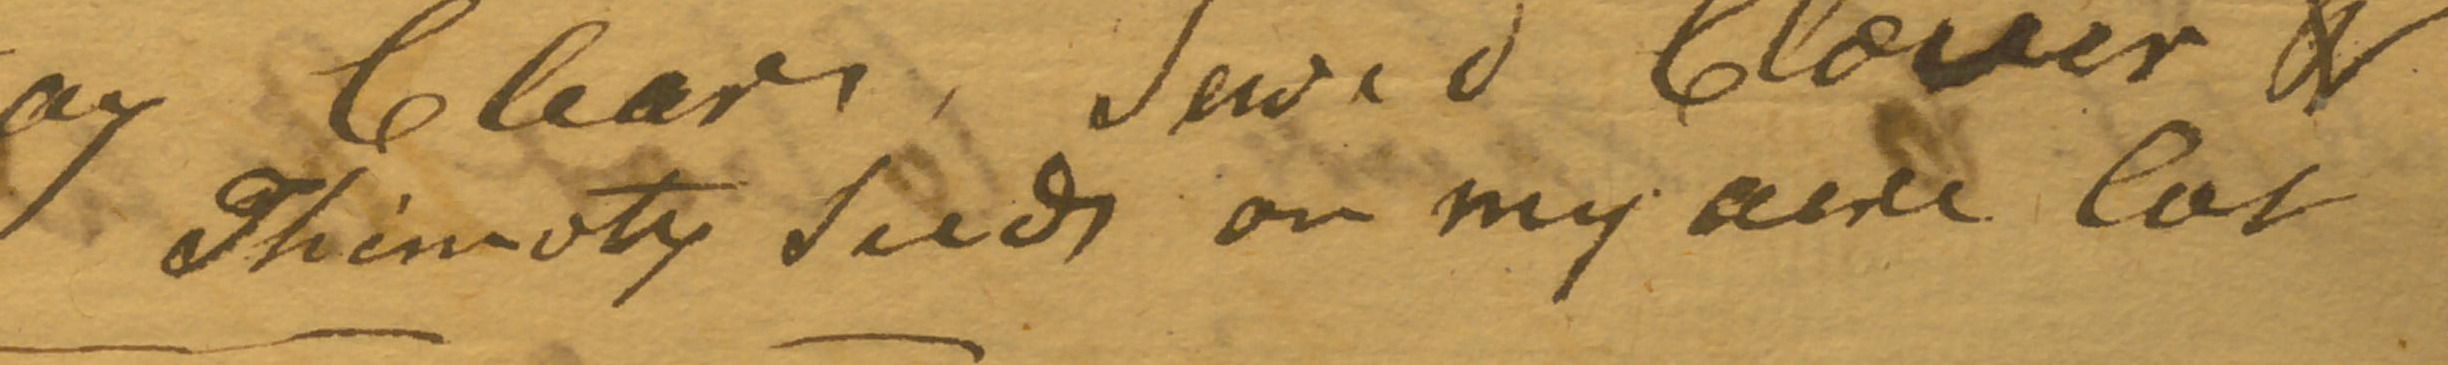Thimoty seeds on my acre lot
